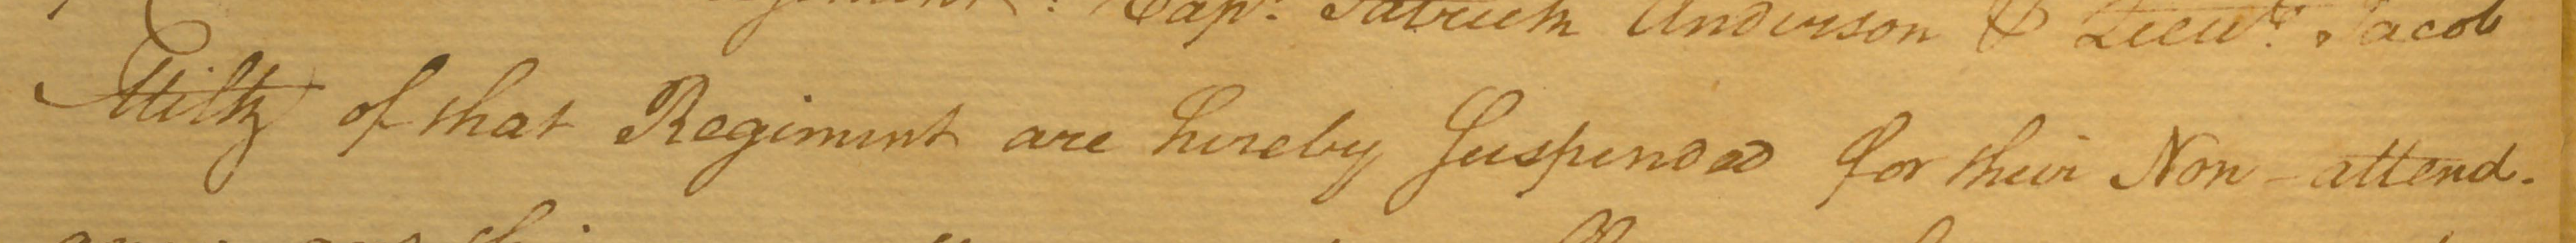Miltz of that Regiment are hereby Suspended for their Non-attend-
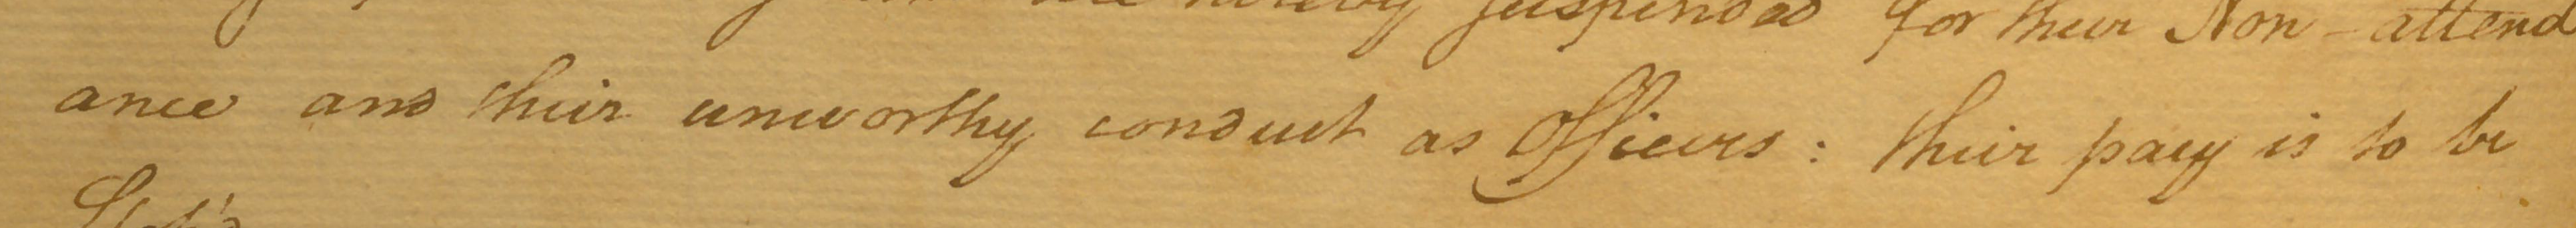ance and their unworthy conduct as Officers: their pay is to be
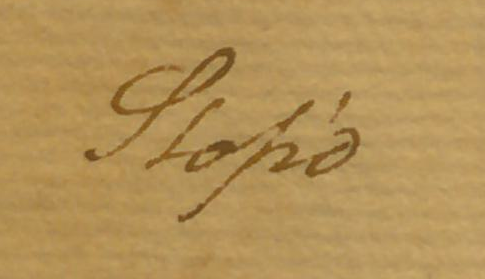Stop'd
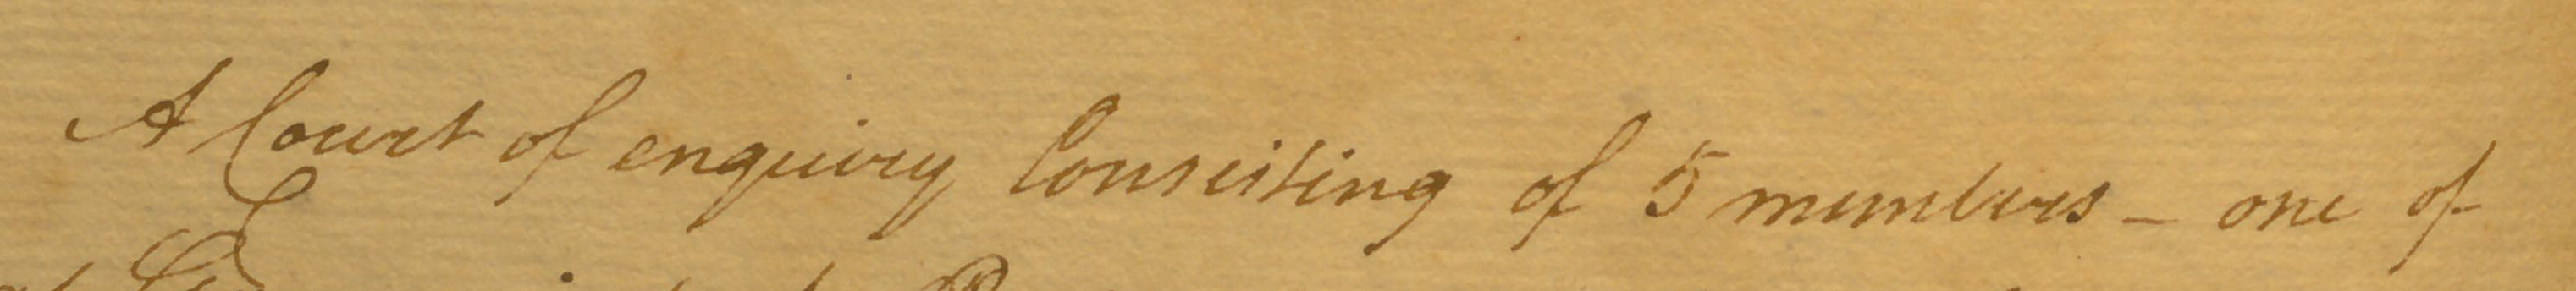A Court of enquiry Consisting of 5 minutes- one of
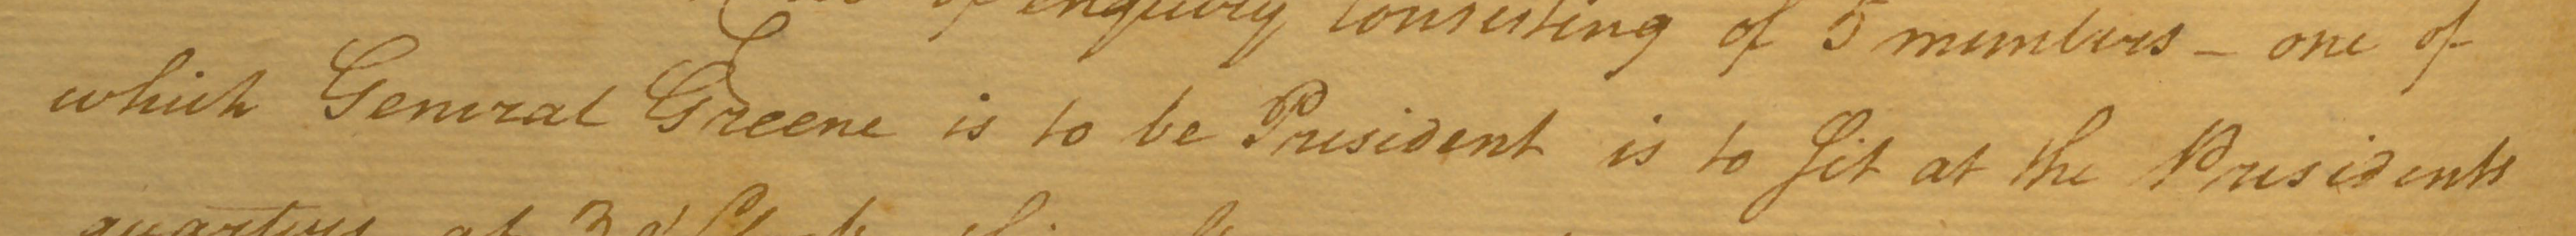which General Greene is to be President is to sit at the Presidents
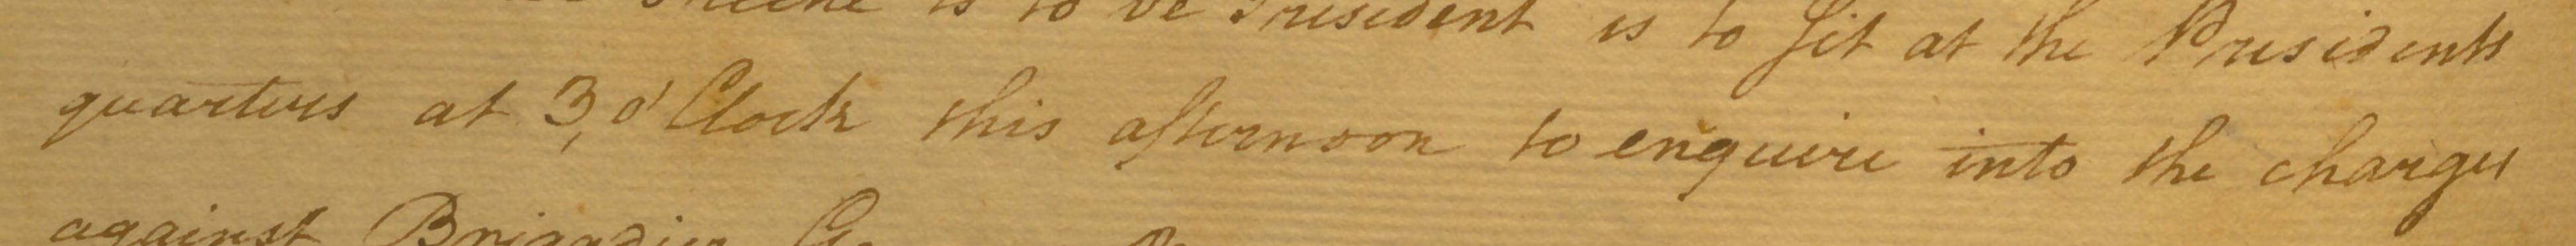quarters at 3, o'Clock this afternoon to enquire into the charges
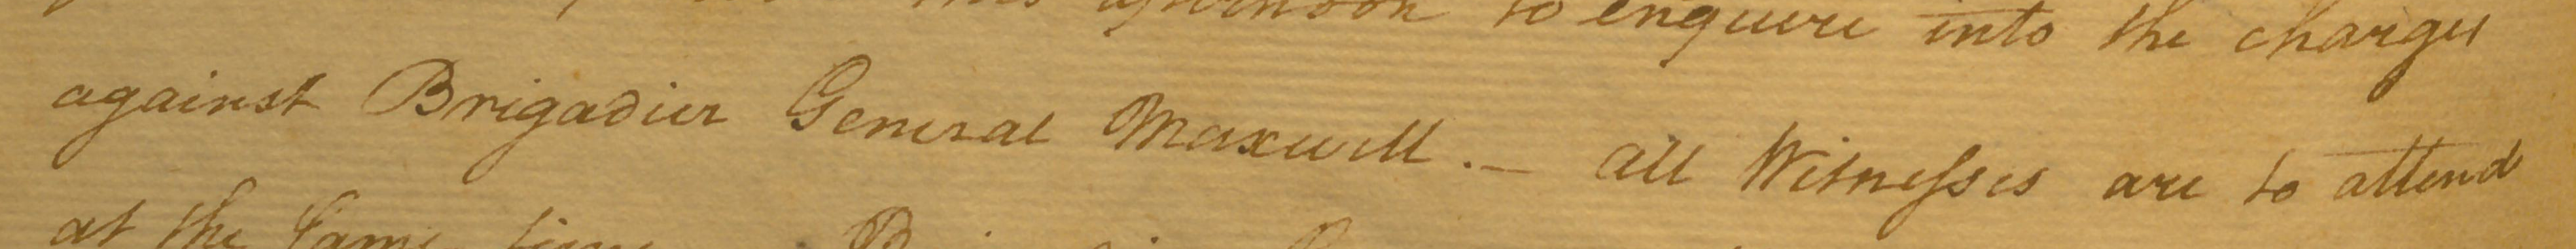against Brigadier General Maxwell.- All Witnesses are to attend
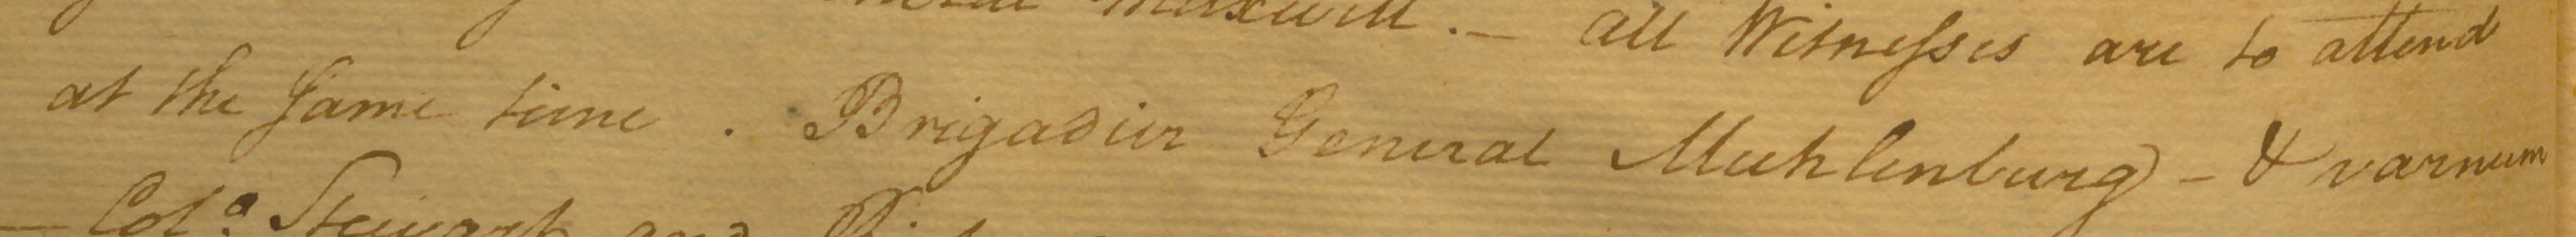at the Same time. Brigadier General Muhlenburg- & varnum
